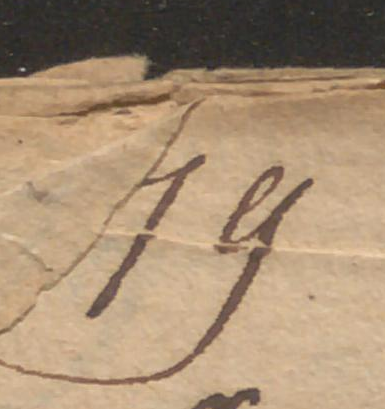79
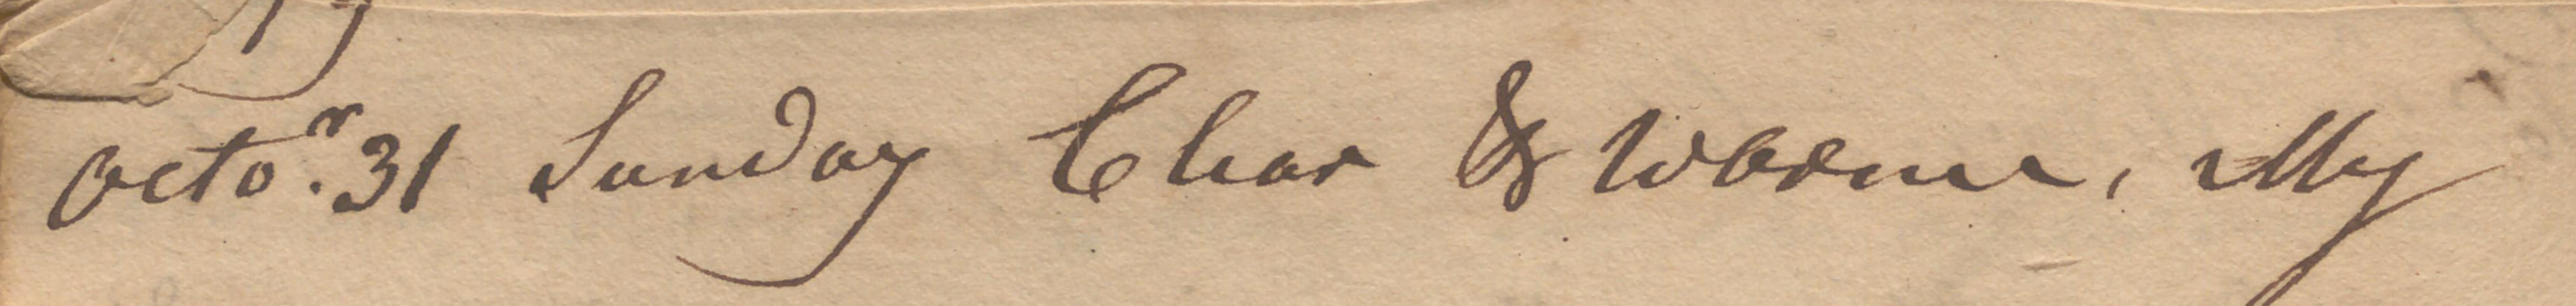Octo^r. 31 Sunday Clear & warme, My
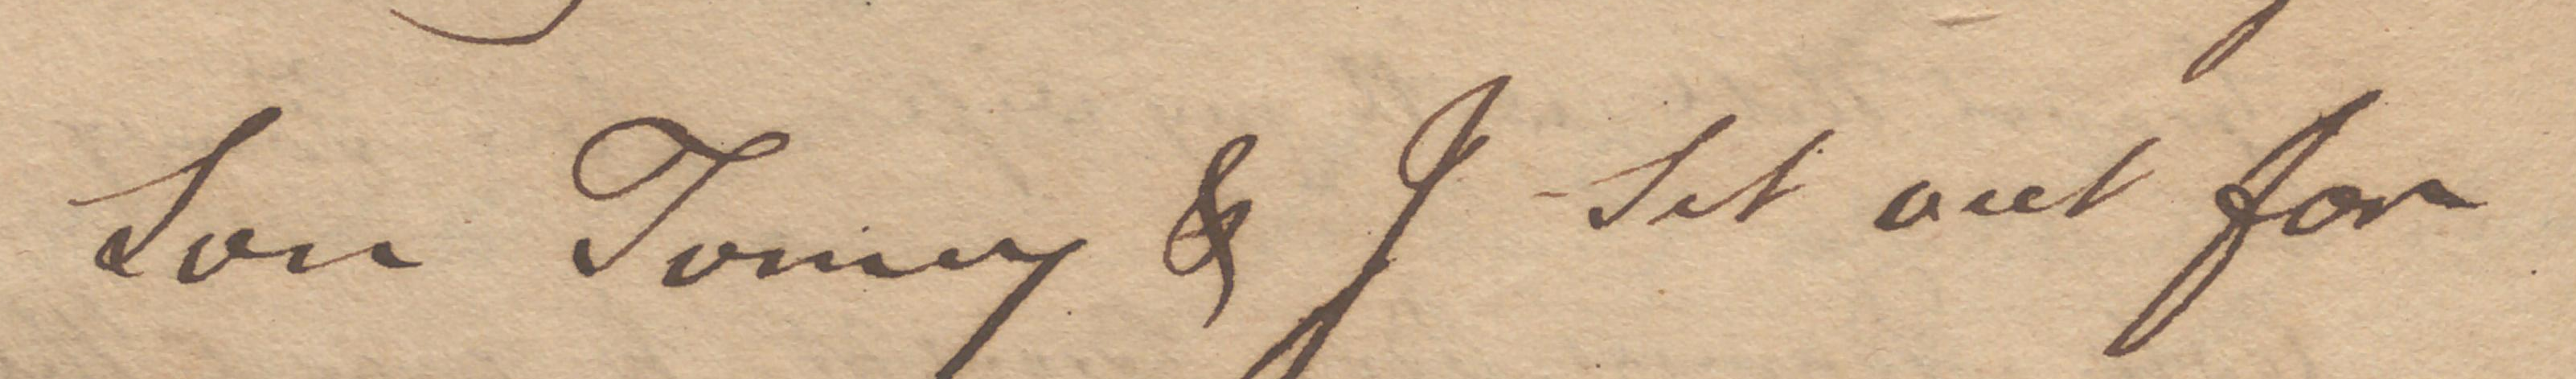Son Tomey & I set out for
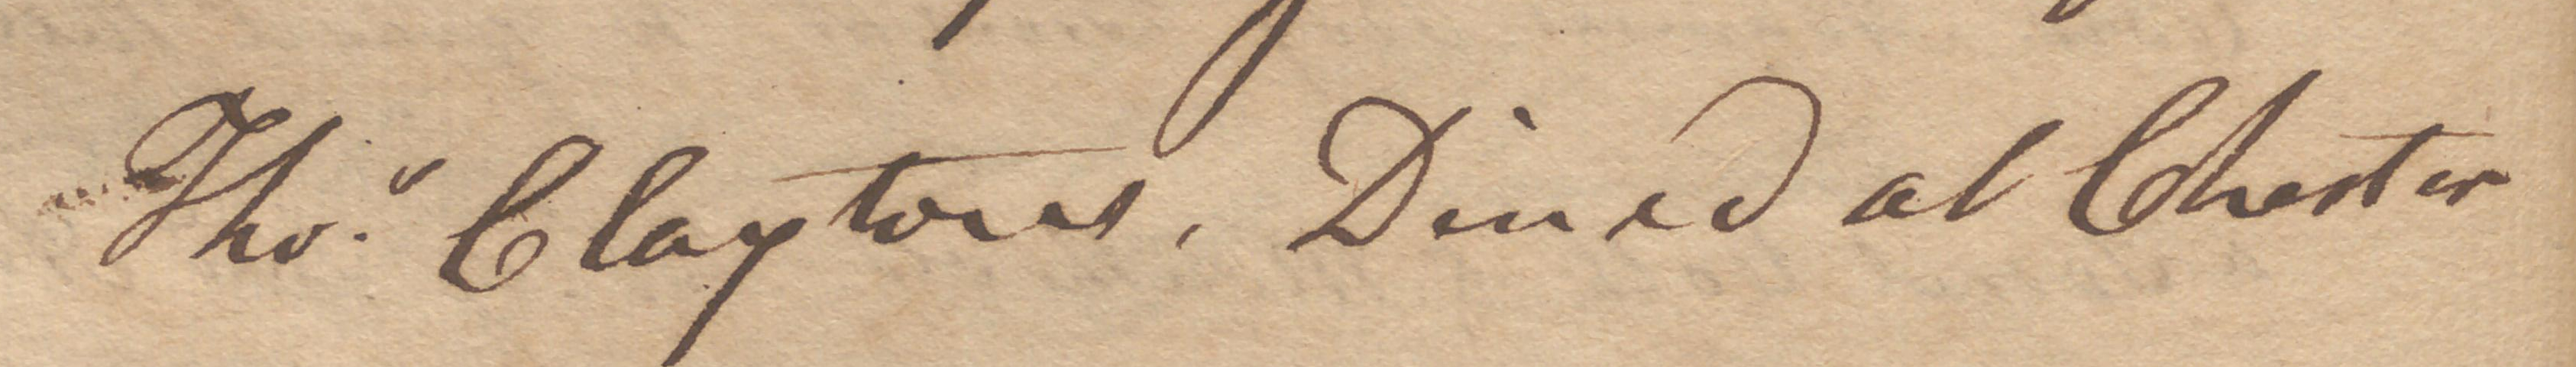Tho^s. Claytons. Dined at Chester
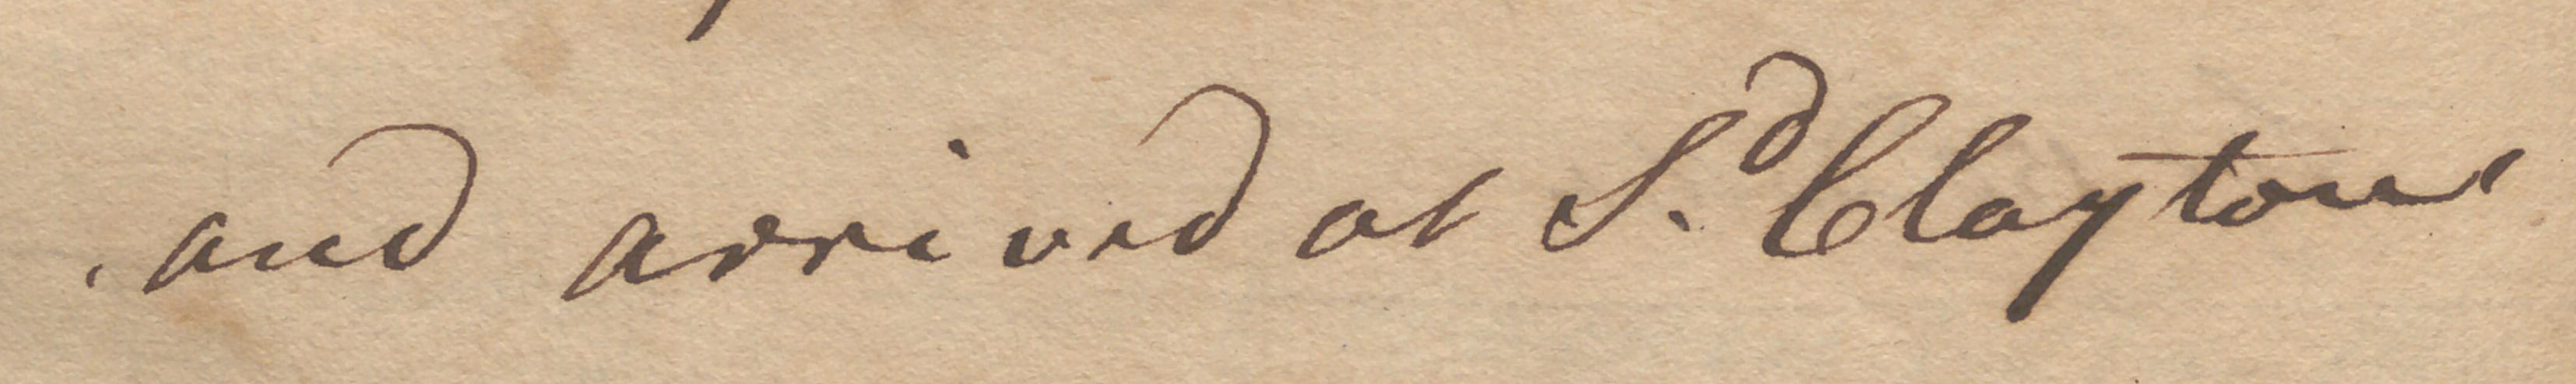and arrived at S^d. Claytons
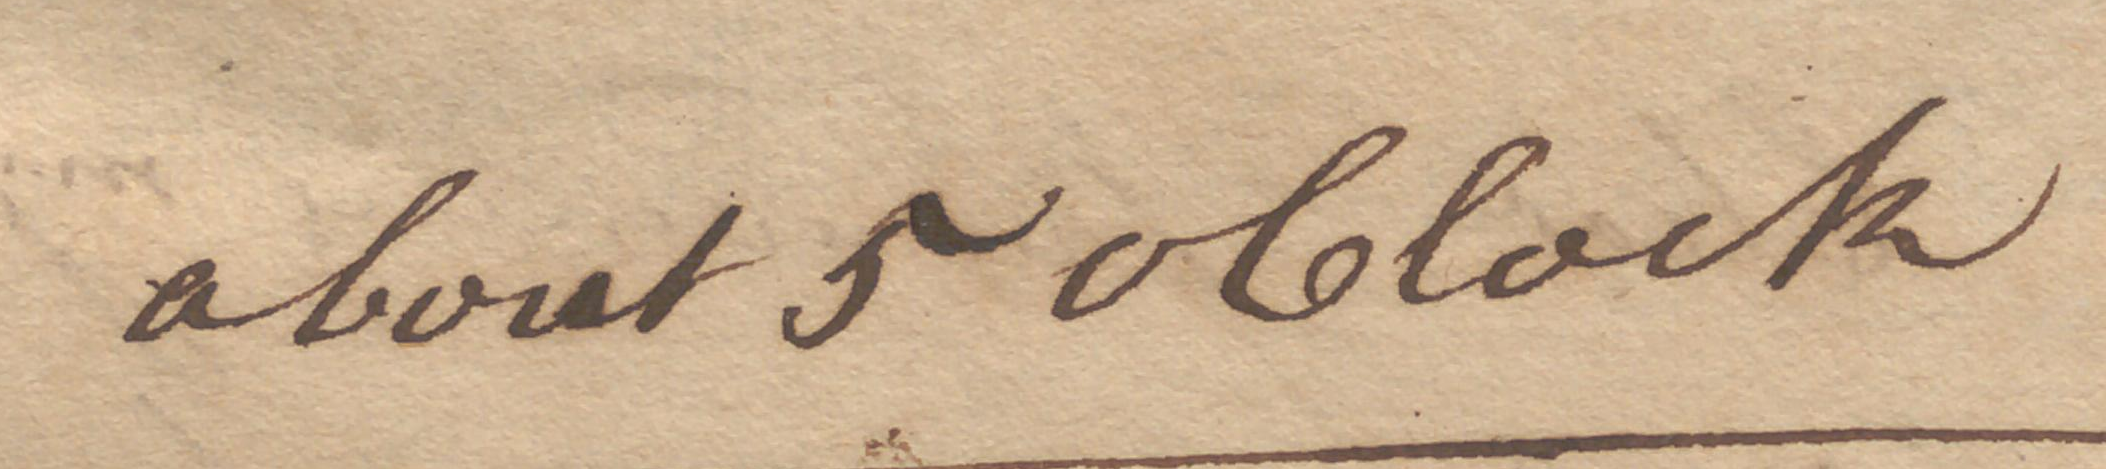about 5 oClock
